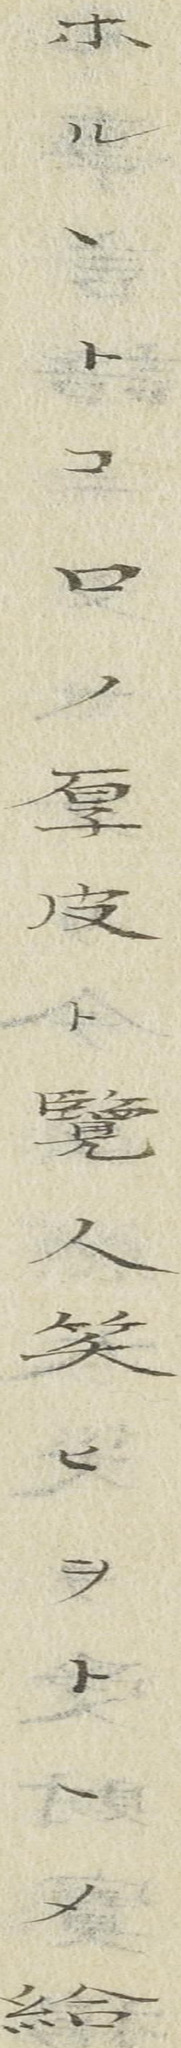ホルヽトコロノ厚皮ト覧人笑ヒヲトヽメ給ヘ
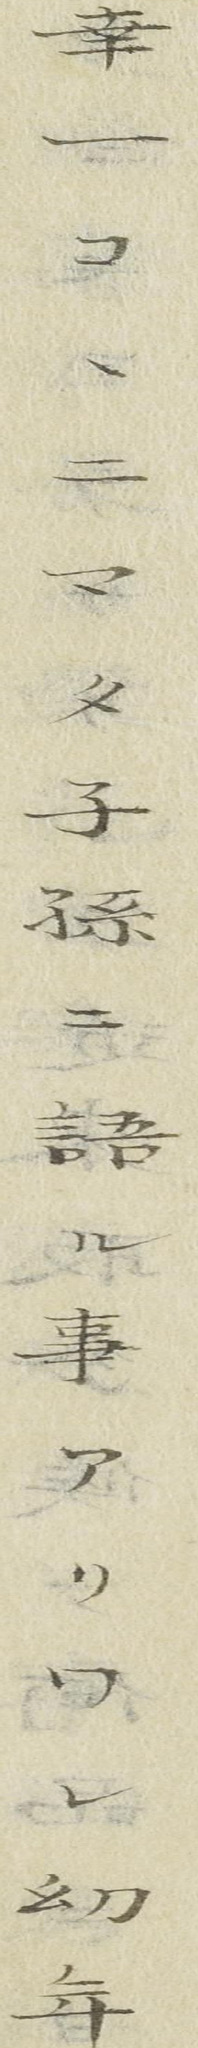幸一コヽニマタ子孫ニ語ル事アリワレ幼年
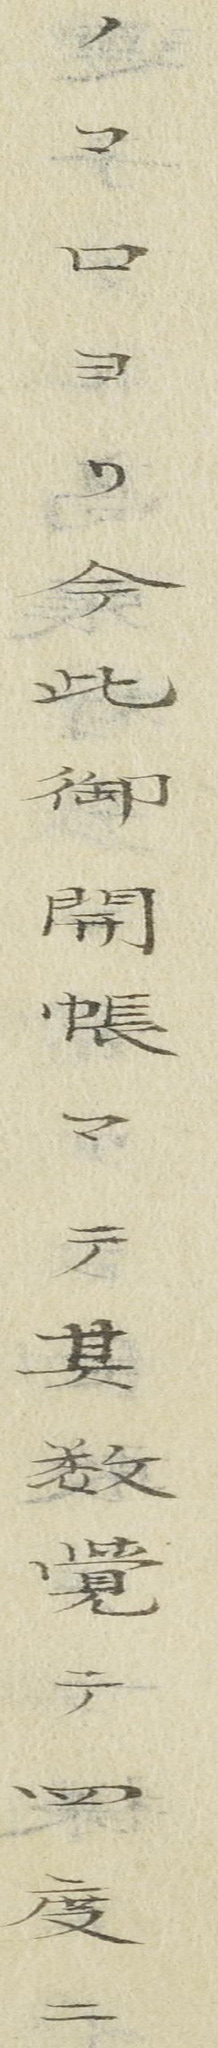ノコロヨリ今此御開帳マテ其数覚テ四度ニ
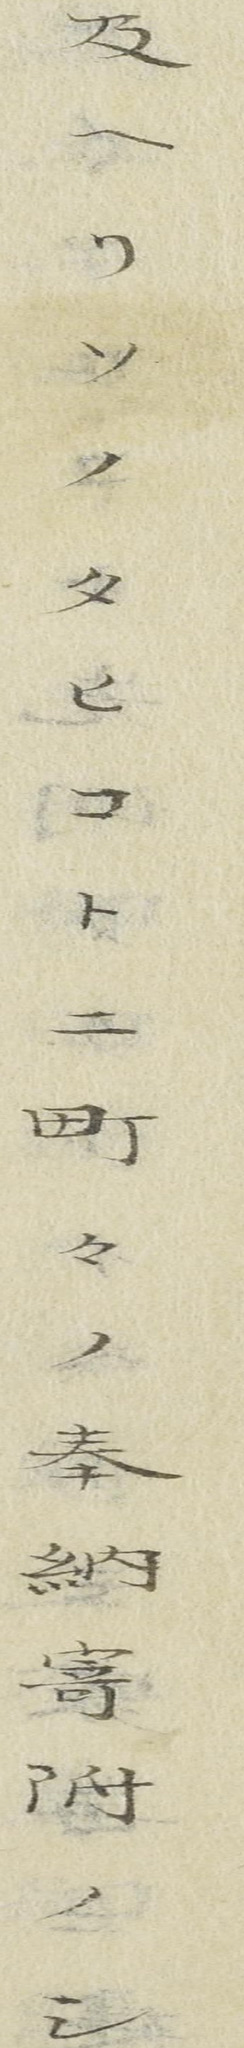及ヘリソノタヒコトニ町々ノ奉納寄附ノシ

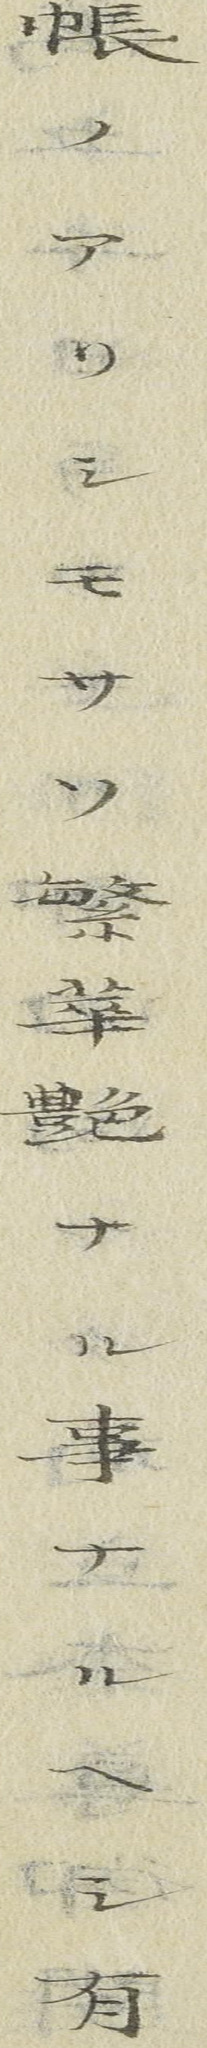帳ノアリシモサソ繁華艶ナル事ナルヘシ有
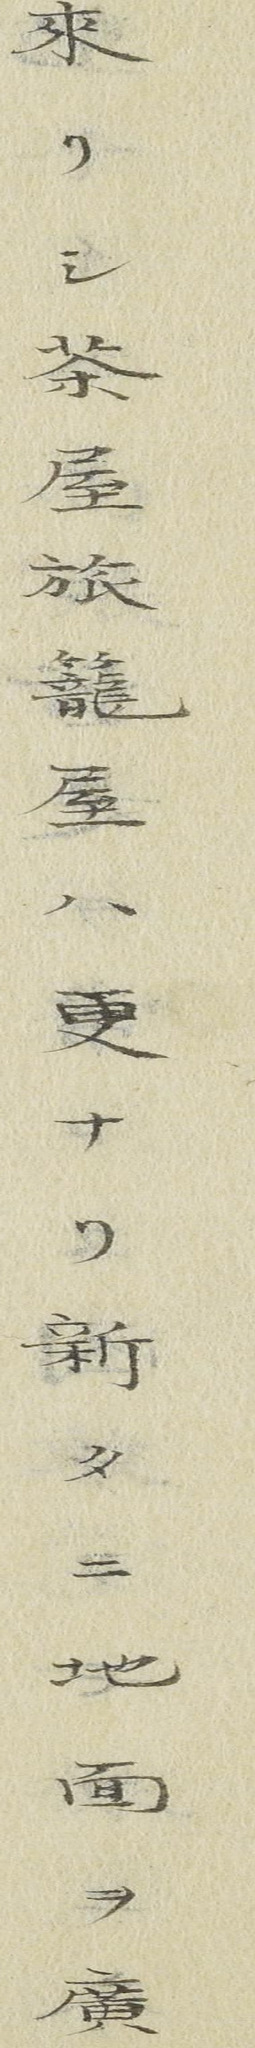来リシ茶屋旅籠屋ハ更ナリ新タニ地面ヲ広
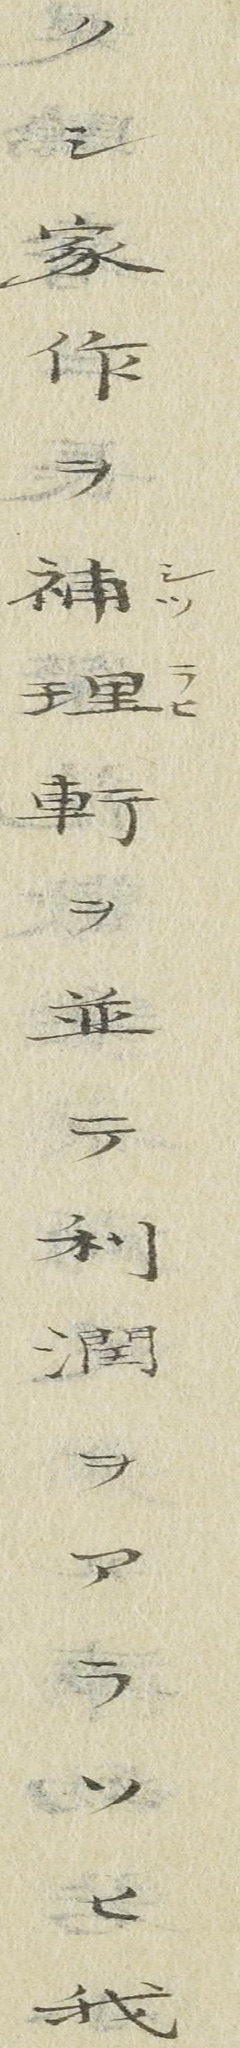クシ家作ヲ補理軒ヲ並テ利潤ヲアラソヒ我
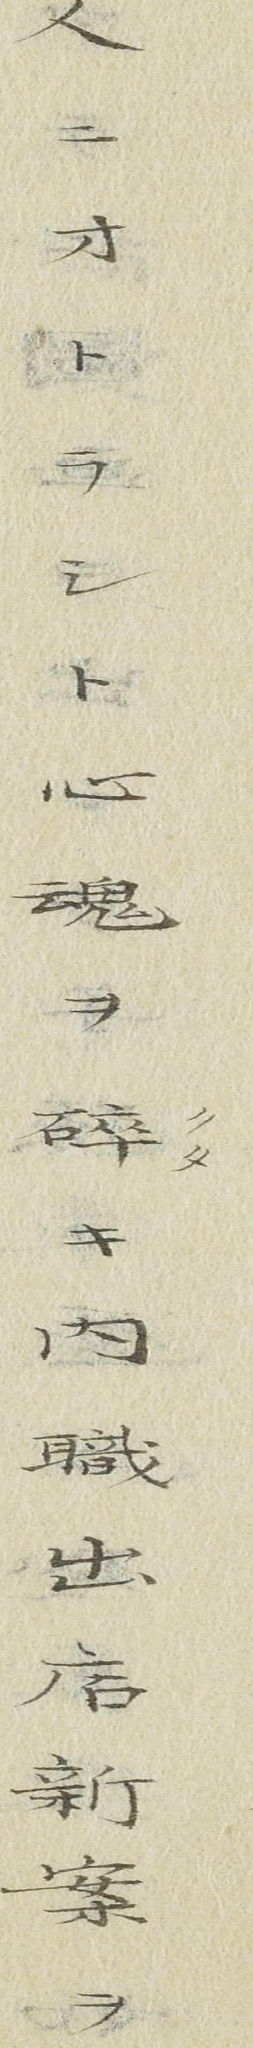人ニオトラシト心魂ヲ砕キ内職出店新案ヲ
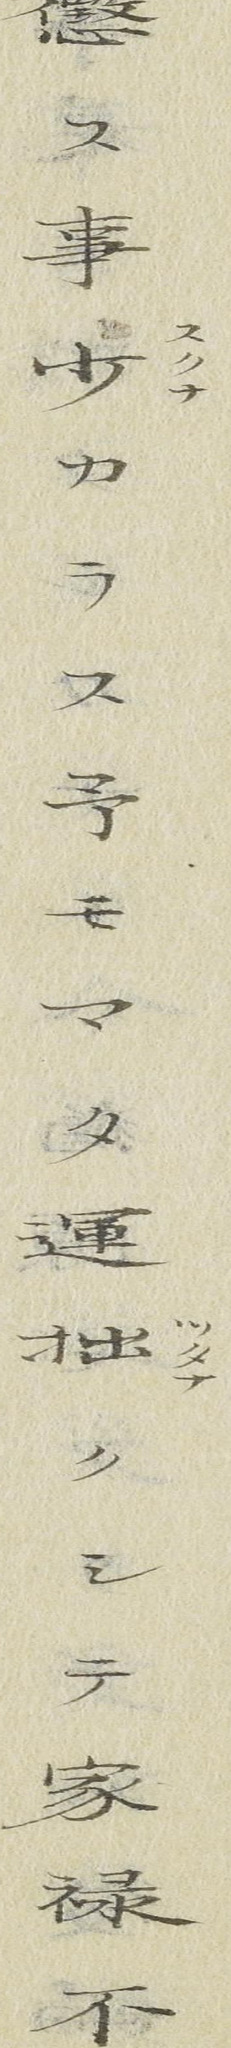懲ス事少カラス予ミマタ運拙クシテ家禄不
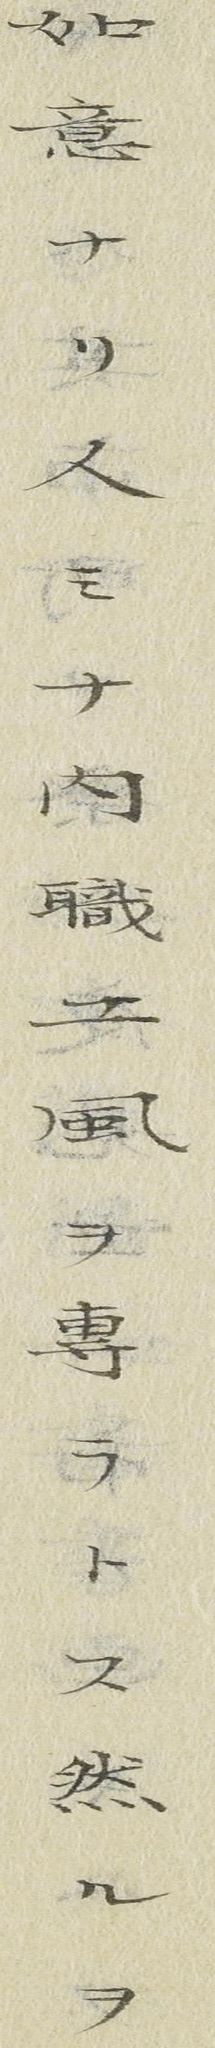如意ナリ人ミナ内職工風ヲ専ラトス然ルヲ
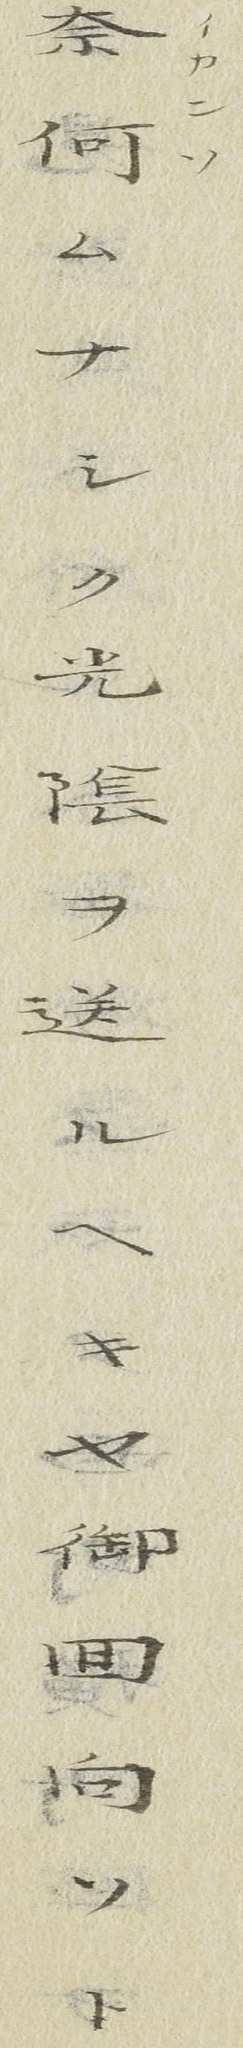奈何ムナシク光陰ヲ送ルヘキヤ御回向ソト
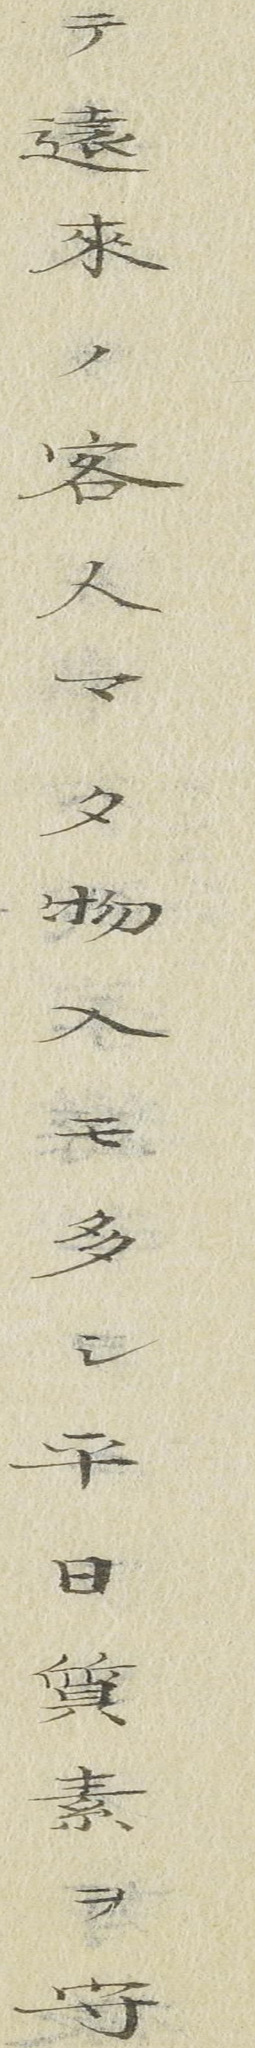テ遠来ノ客人マタ物入モ多シ平日質素ヲ守
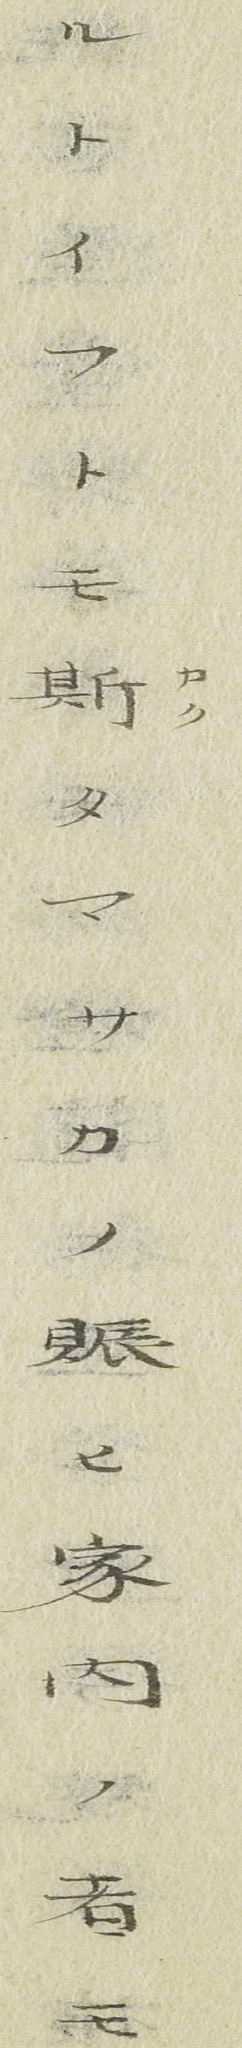ルトイフトモ斯タマサカノ賑ヒ家内ノ者モ
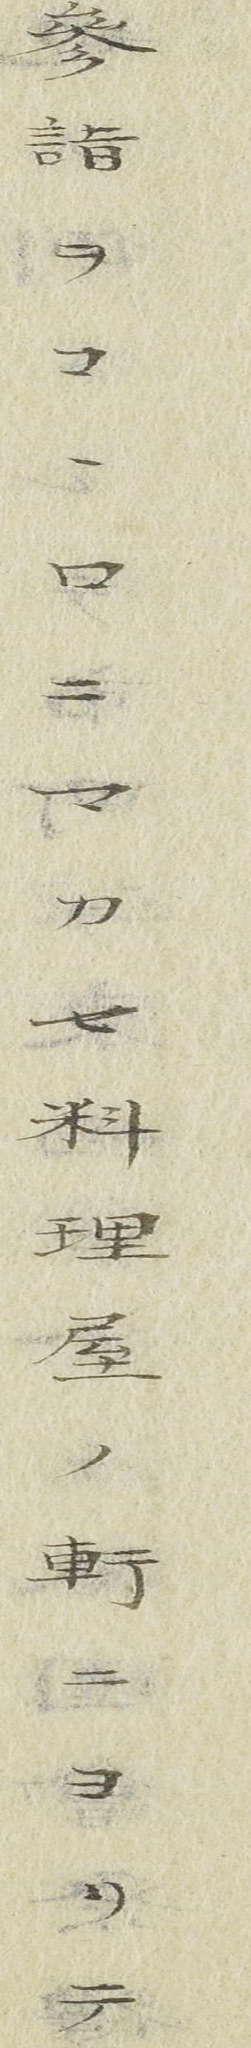参詣ヲコヽロニマカセ料理屋ノ軒ニヨリテ
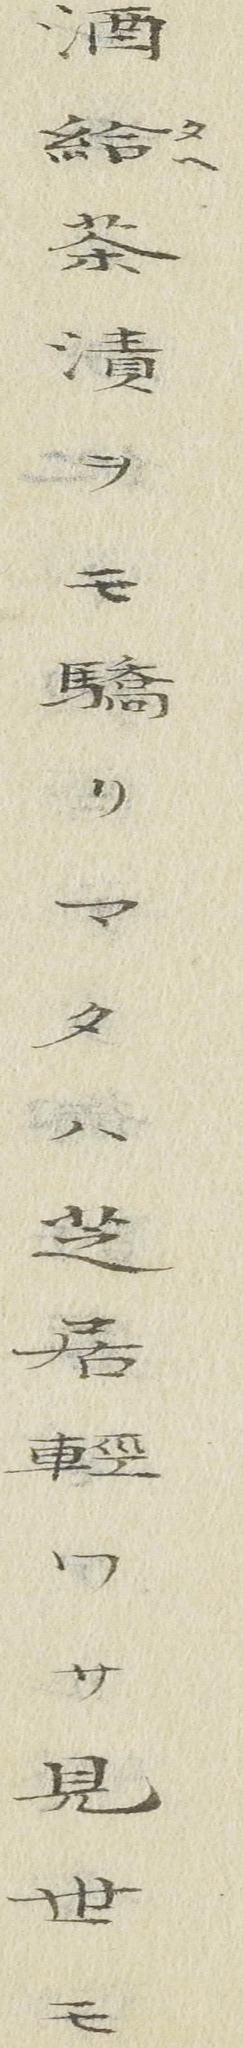酒給茶漬ヲモ驕リマタハ芝居軽ワサ見世モ
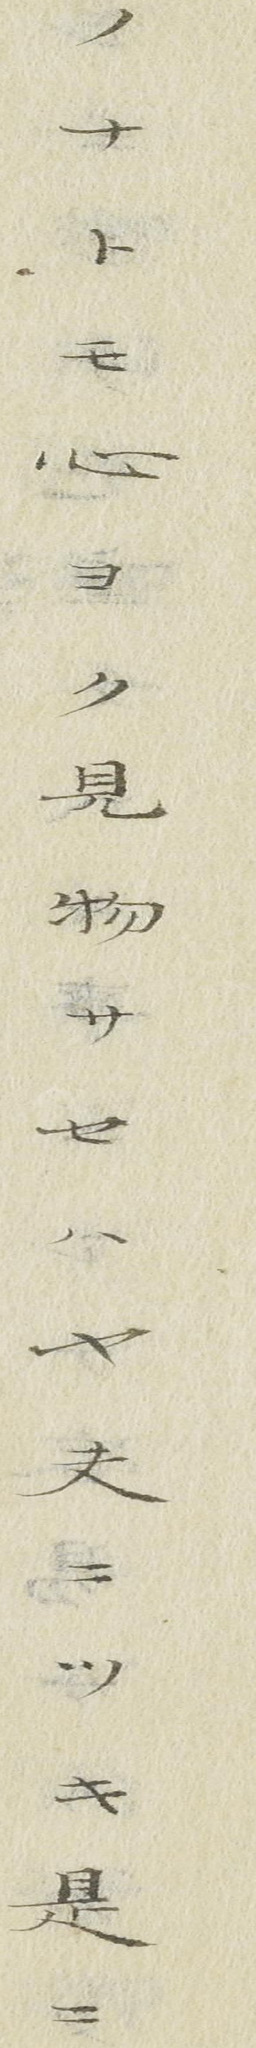ノナトモ心ヨク見物サセハヤ夫ニツキ是ニ
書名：地災撮要　地震之部　巻ノ二
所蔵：東京大学地震研究所図書室 Earthquake Research Institute Library, The University of Tokyo, JAPAN
